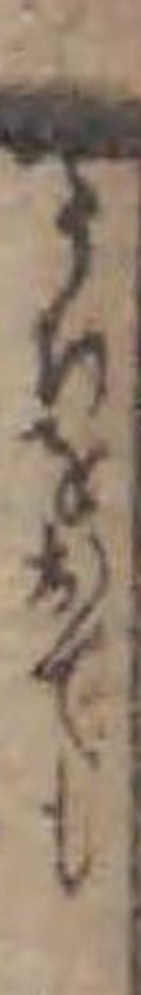うちを出ても
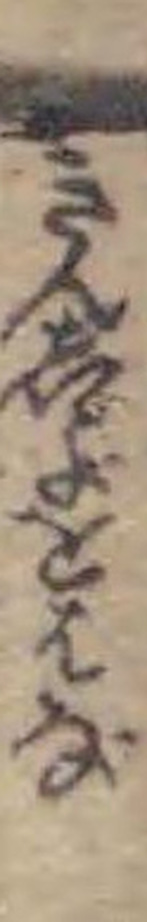きんしよをはな
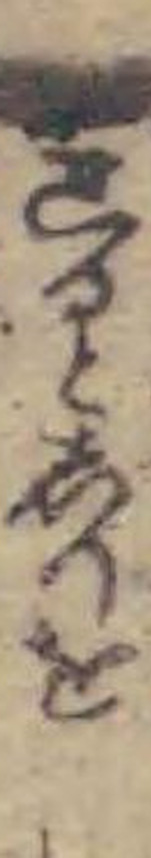れるとしりを
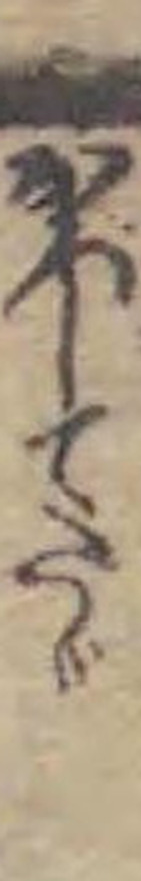おろしてたゞ
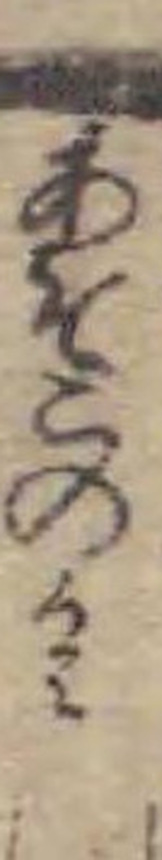あそこのかみ
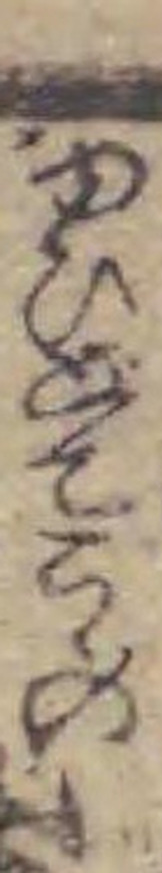ゆひとここゝの
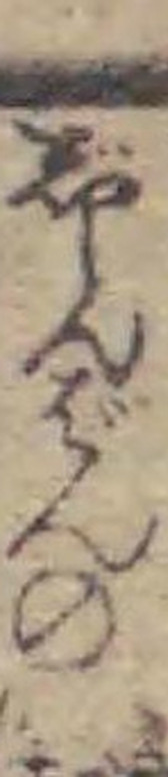じしんばんの
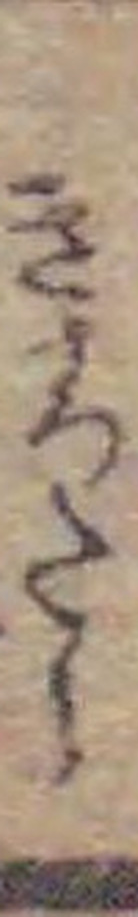きさつたら
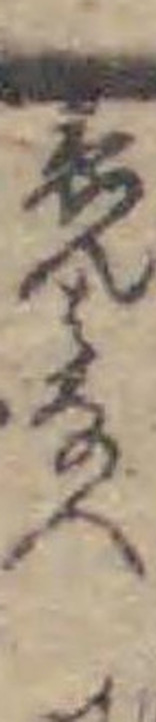ゑんはなへ
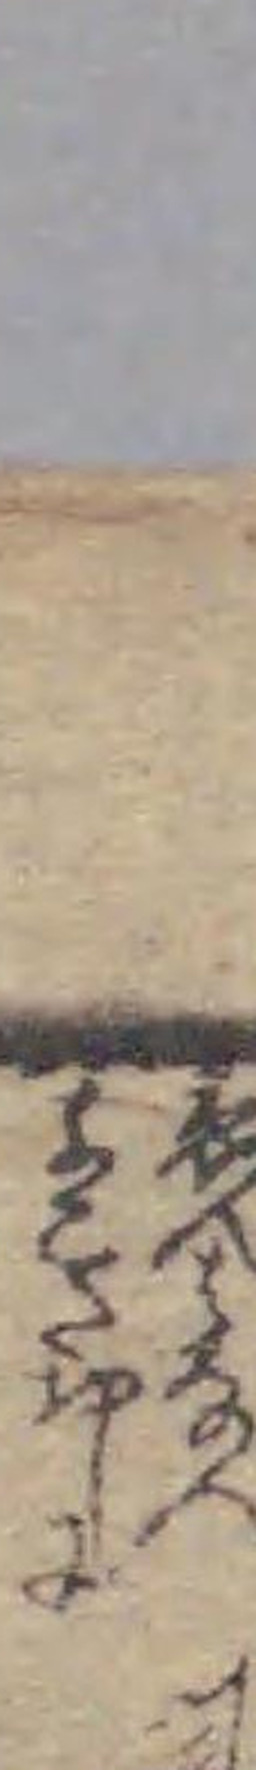よこたおしに
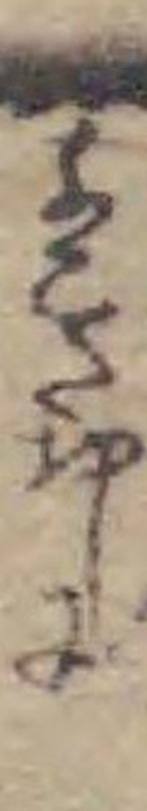よこたおしに
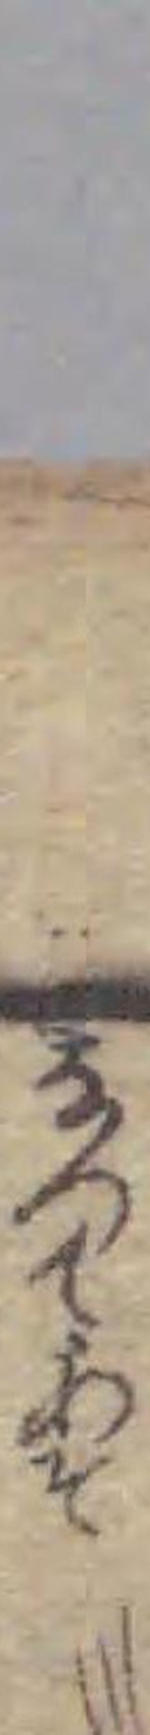なつてあそ
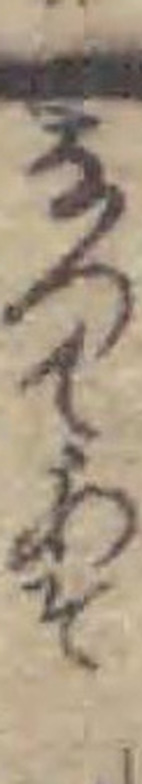なつてあそ
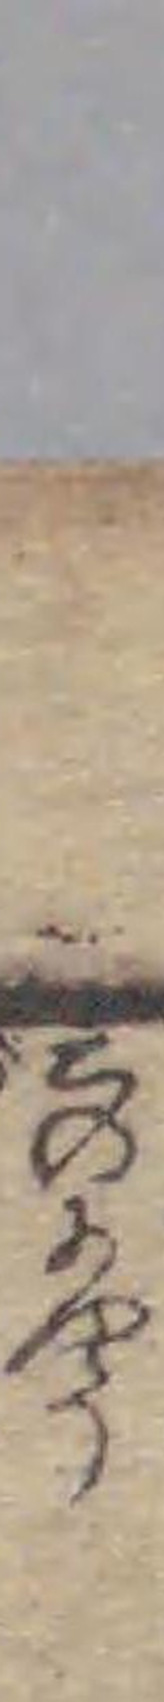このにやう
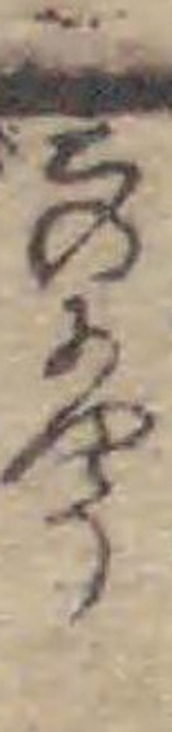このにやう
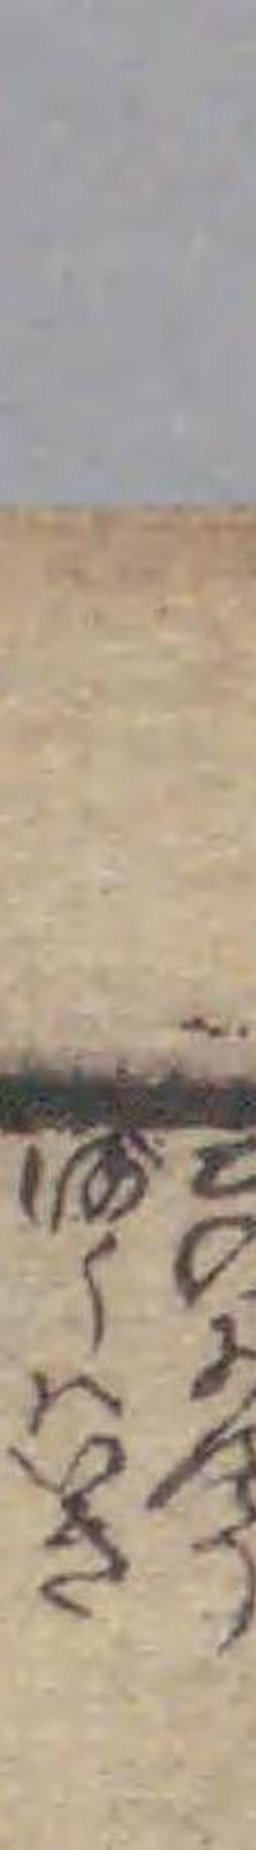ぼうはいき
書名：通風伊勢物語 : 3巻
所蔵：国立国会図書館 National Diet Library, JAPAN
